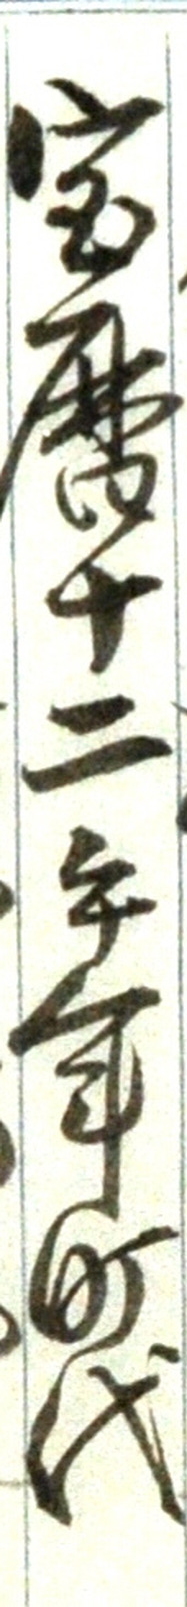宝暦十二午年町代
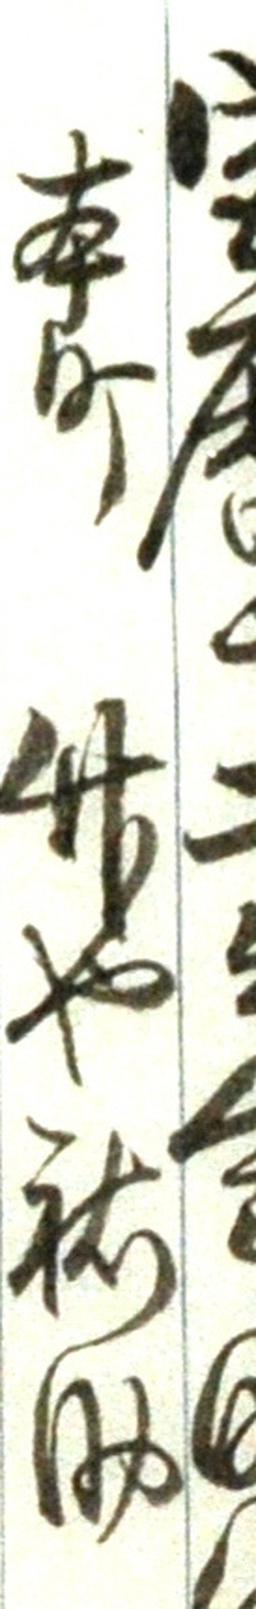本町竹や祐助
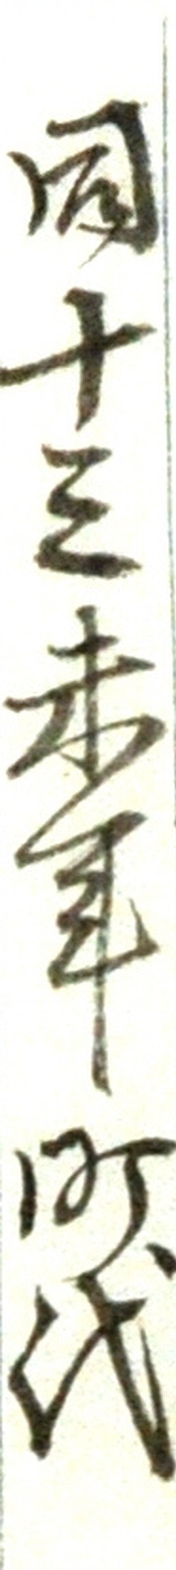同十三未年町代

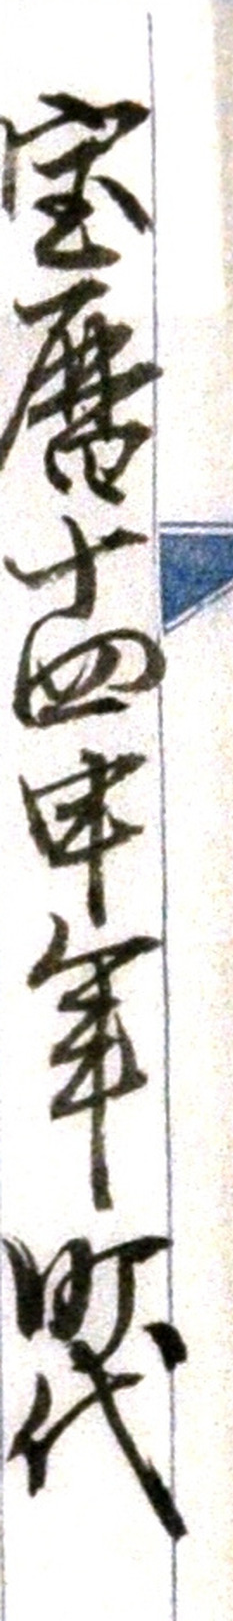宝暦十四申年町代
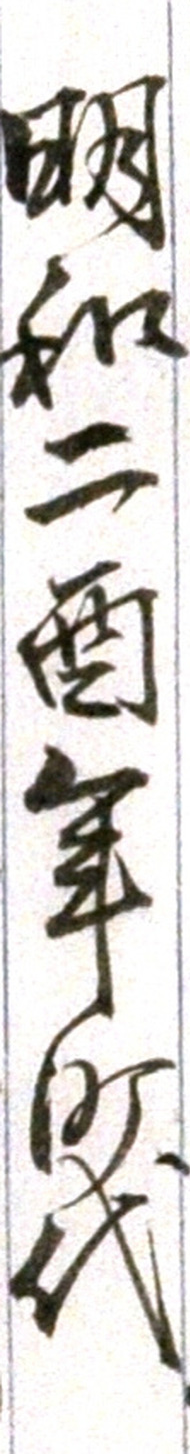明和ニ酉年町代
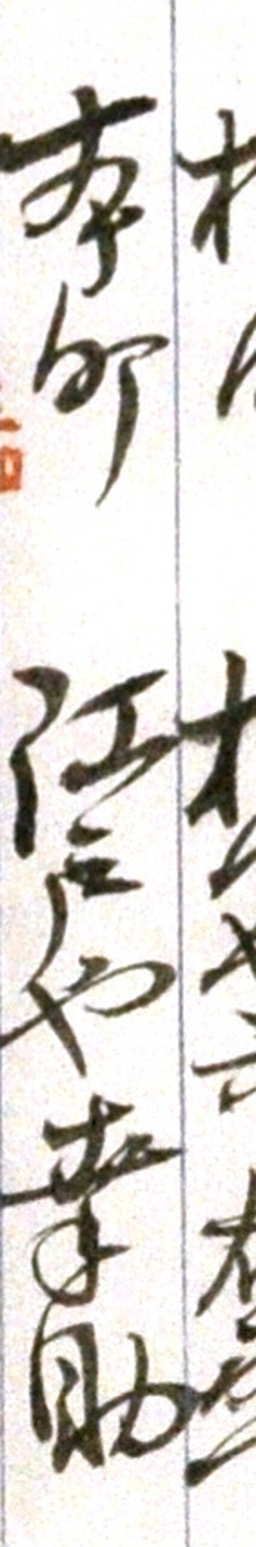本町江戸や幸助
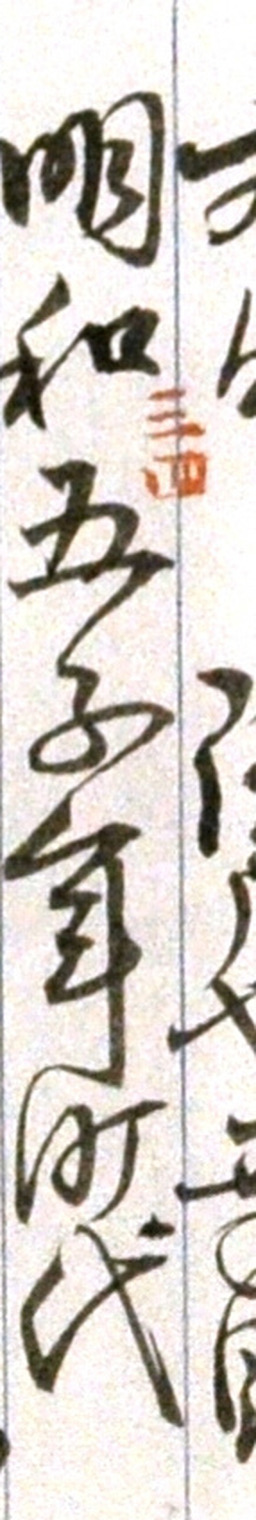明和五子年町代
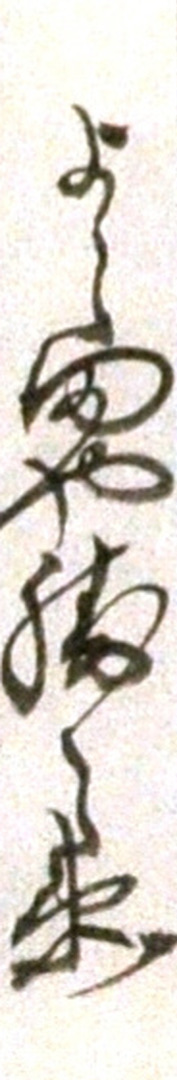よし田や勝兵衛
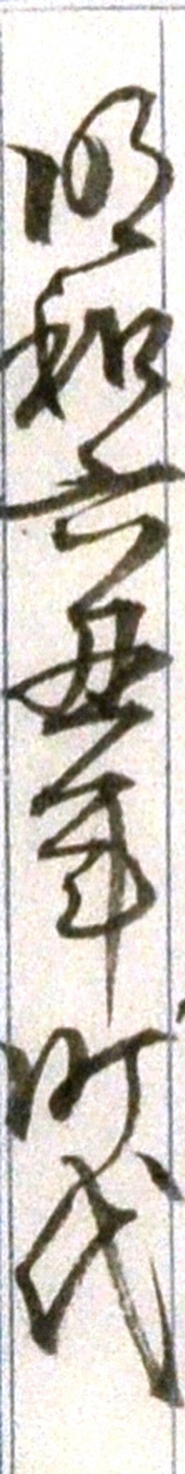明和六丑年町代
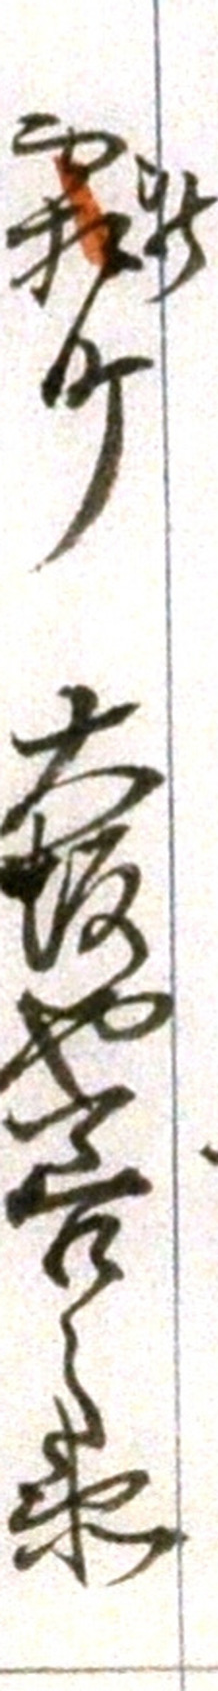新町大坂や善兵衛
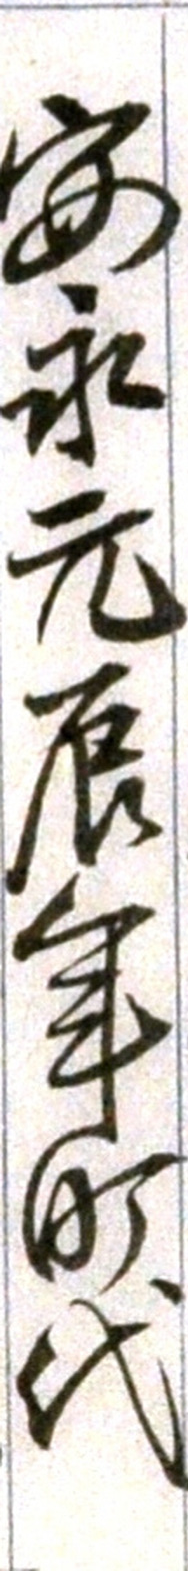安永元辰年町代
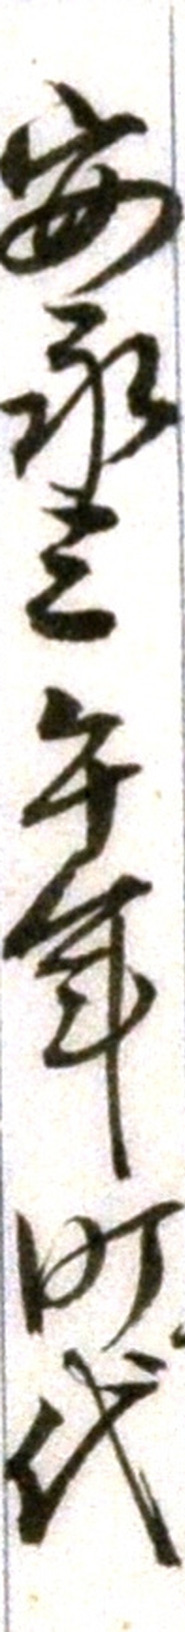安永三午年町代
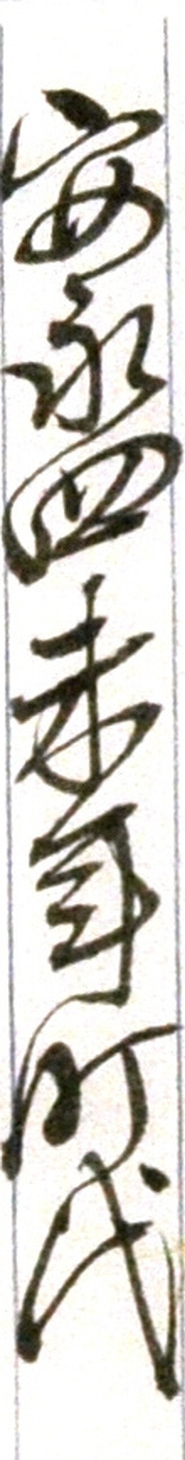安永四未年町代

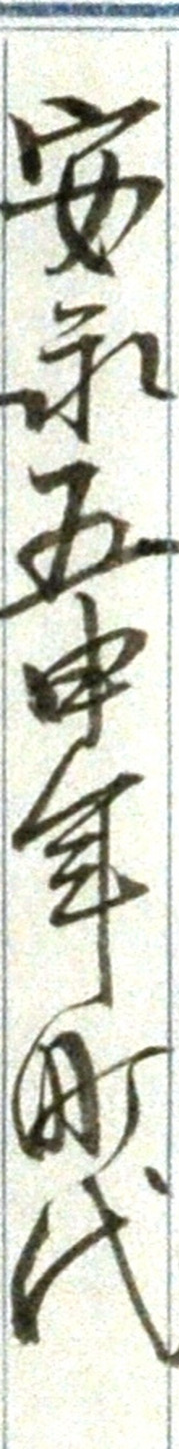安永五申年町代
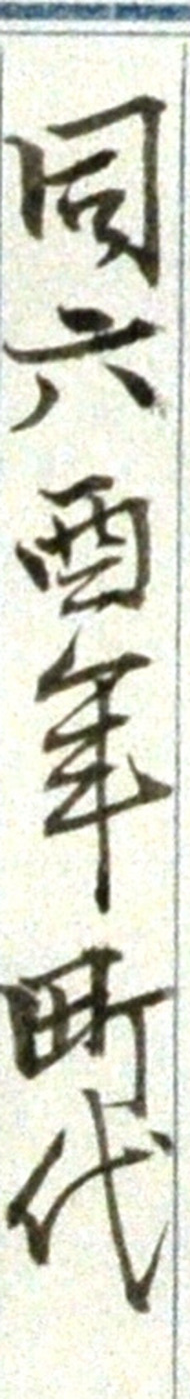同六酉年町代
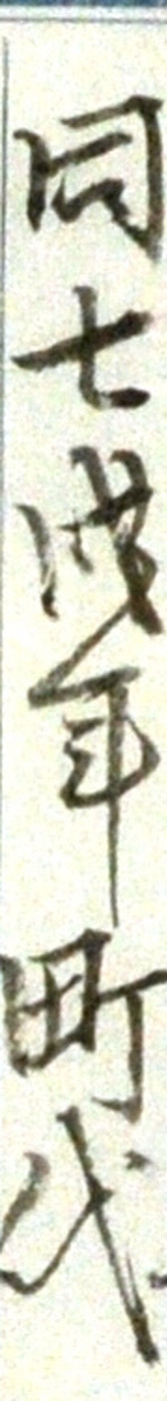同七戌年町代
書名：町方町代名前書
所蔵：伊那市立高遠町図書館・合同会社AMANE
